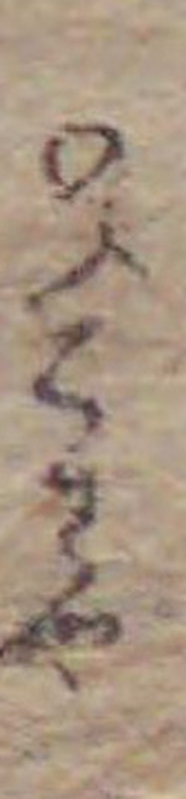のふこわや
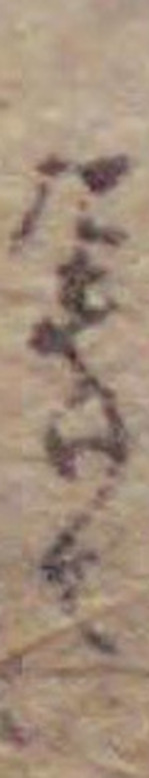たすけて
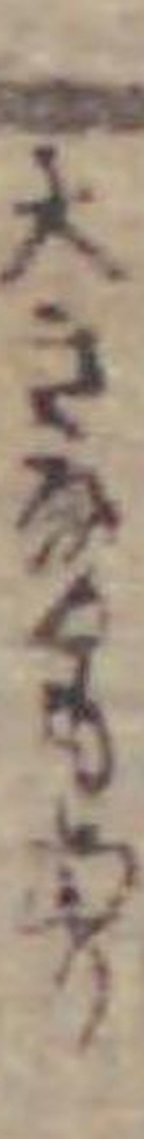大きなるもあり
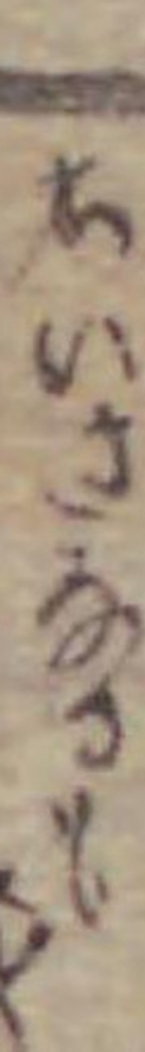ちいさなるも

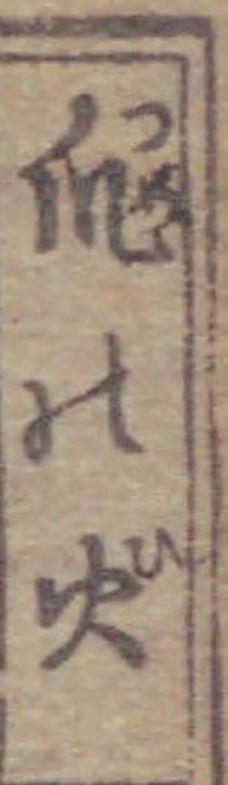爪の火
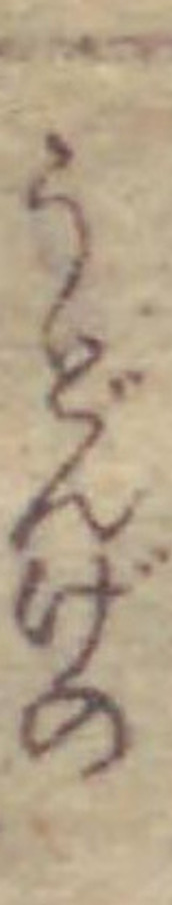うどんげの
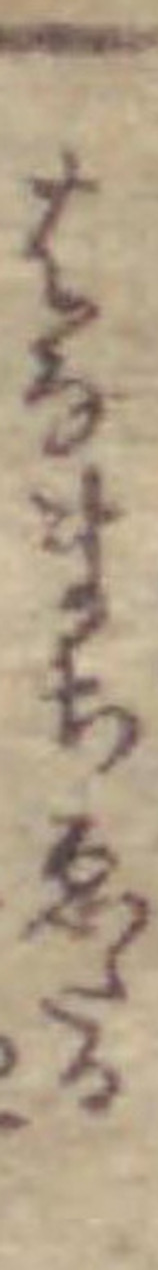はなまちゑたると
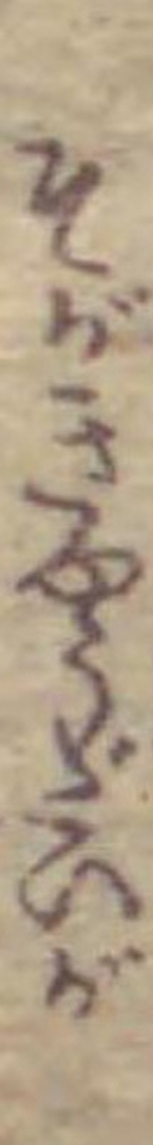そがきやうだいが
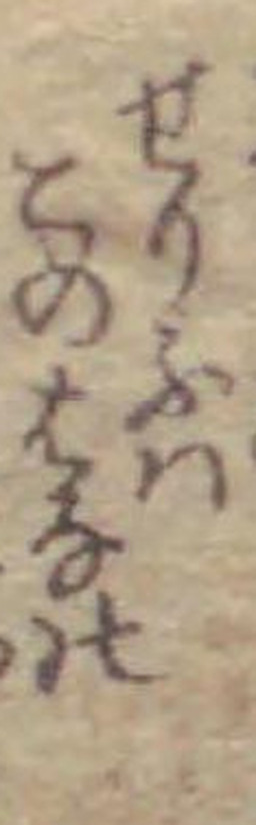このはなの
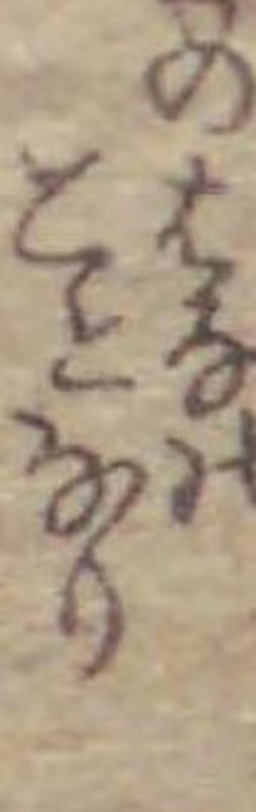ことなり
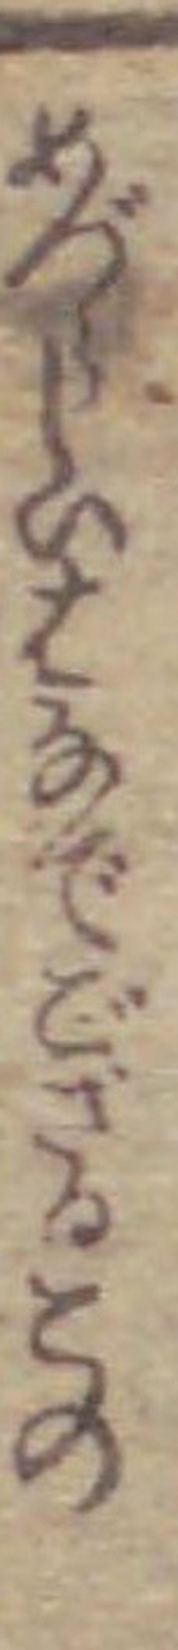めづらしいはなでござるこの
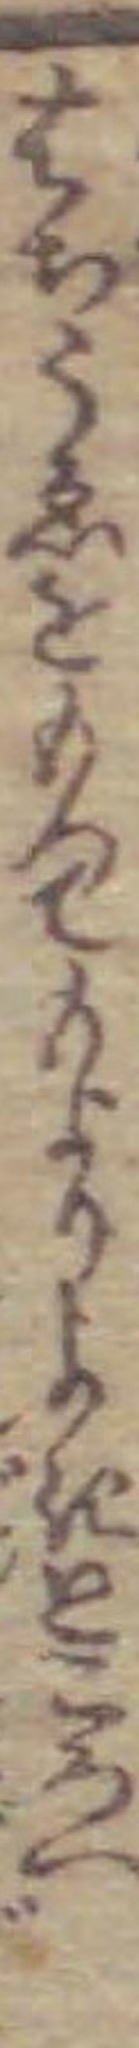はちうゑをもつてもよりよきところへ

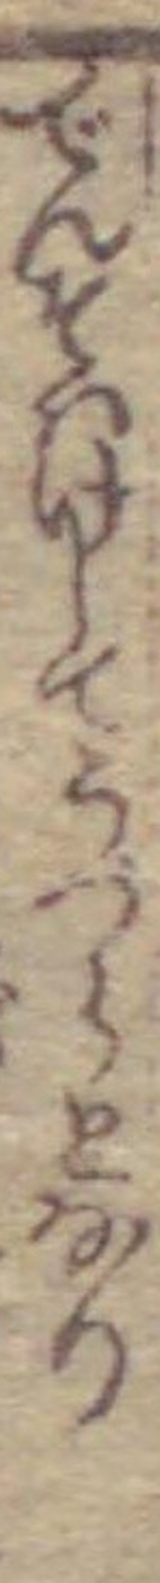でんそはけしてうづらとなり
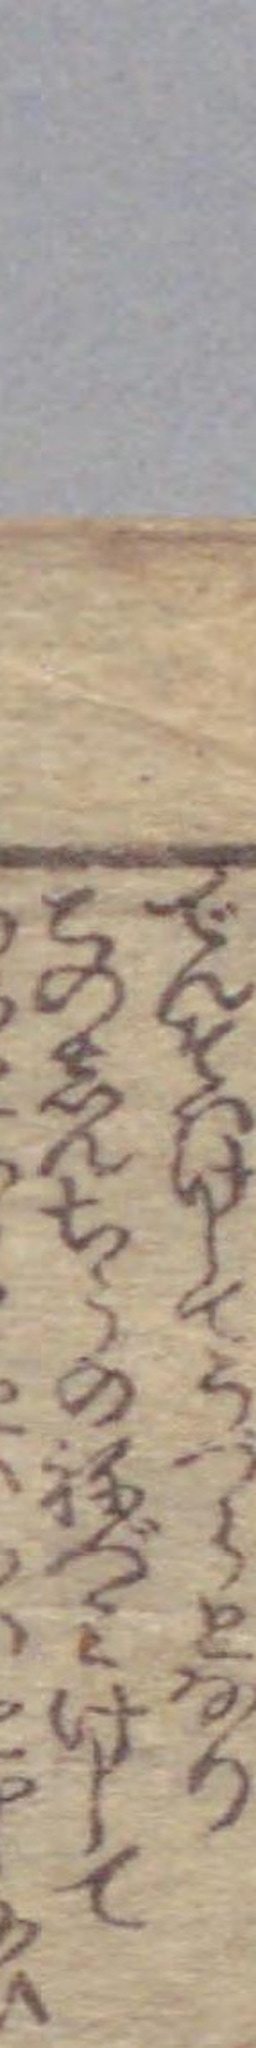このしんちうのねづみけして
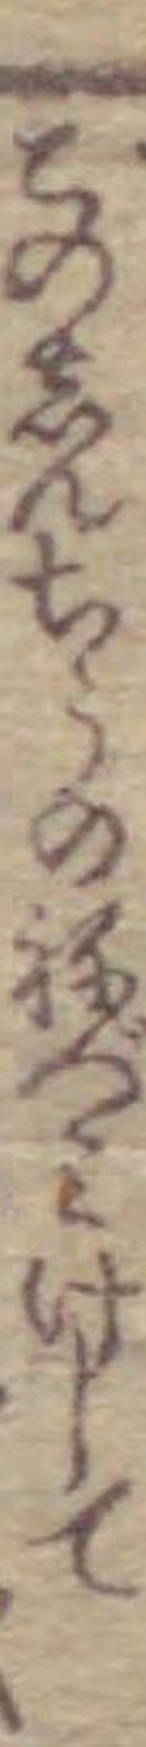このしんちうのねづみけして
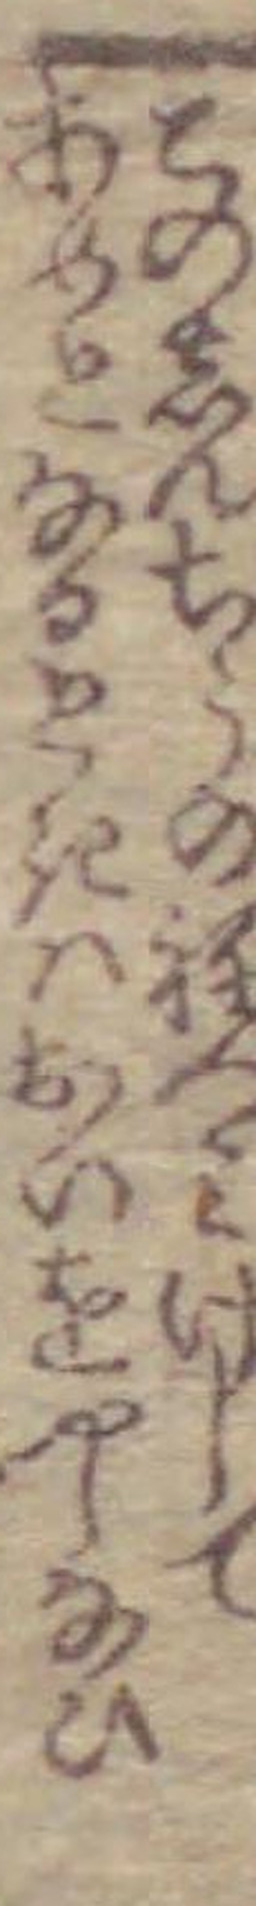あめとなるときはおいをやしなひ
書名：化物和本草 : 3巻
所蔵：国立国会図書館 National Diet Library, JAPAN
